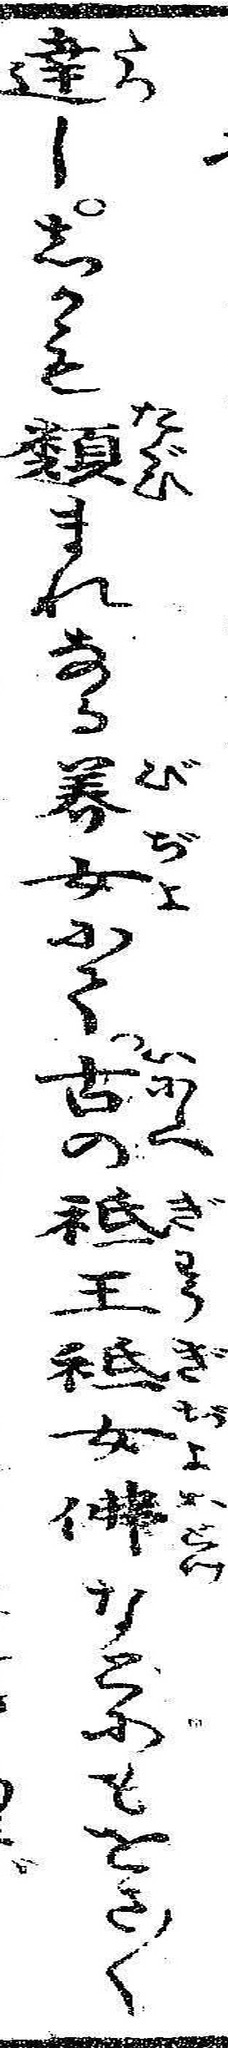達し。しかも類まれなる美女にて。古の祇王祇女仏なとにもをさ〳〵
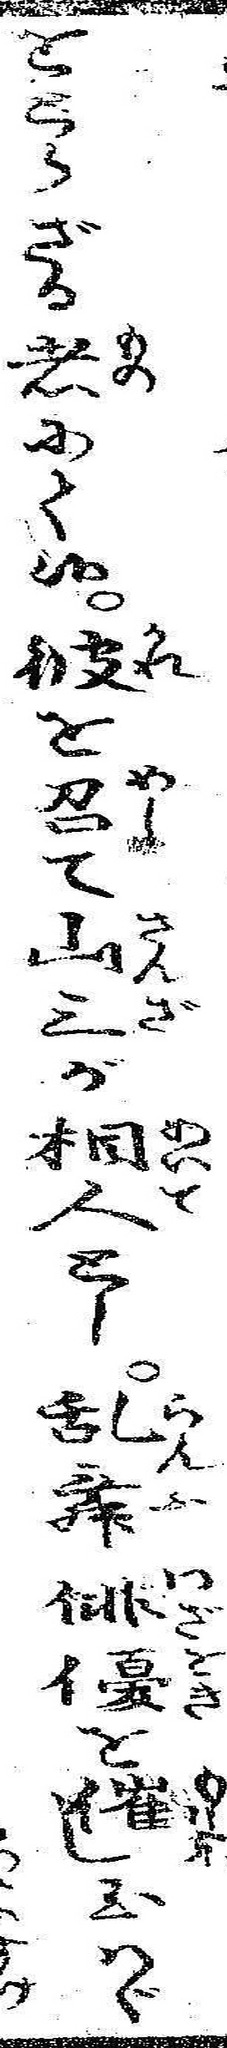をとらざる者にて候。彼を召て山三が相人とし。乱舞俳優を催し玉はゞ
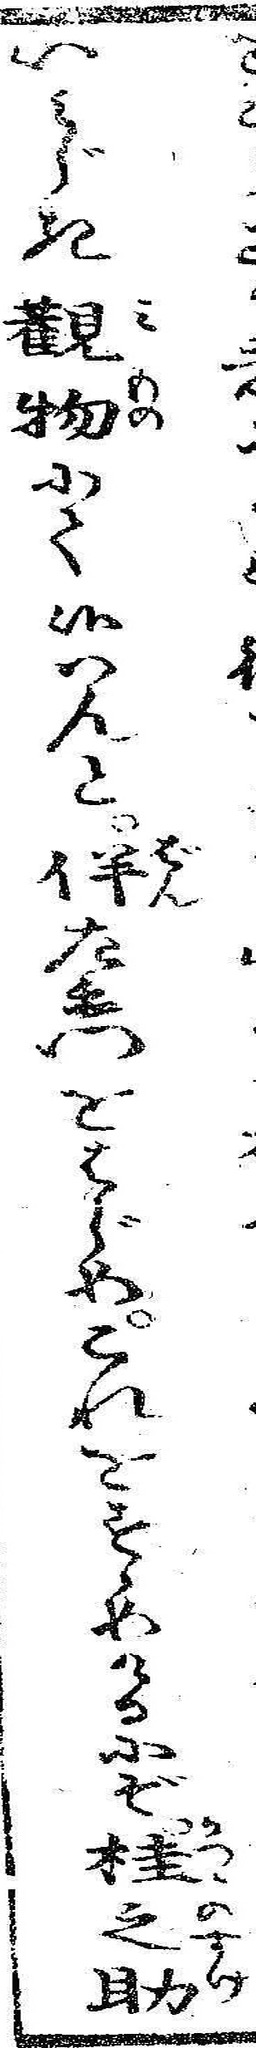いみじき観物にて候はんと。伴左衛門をはじめ。これをすゝめけるにぞ。桂之助

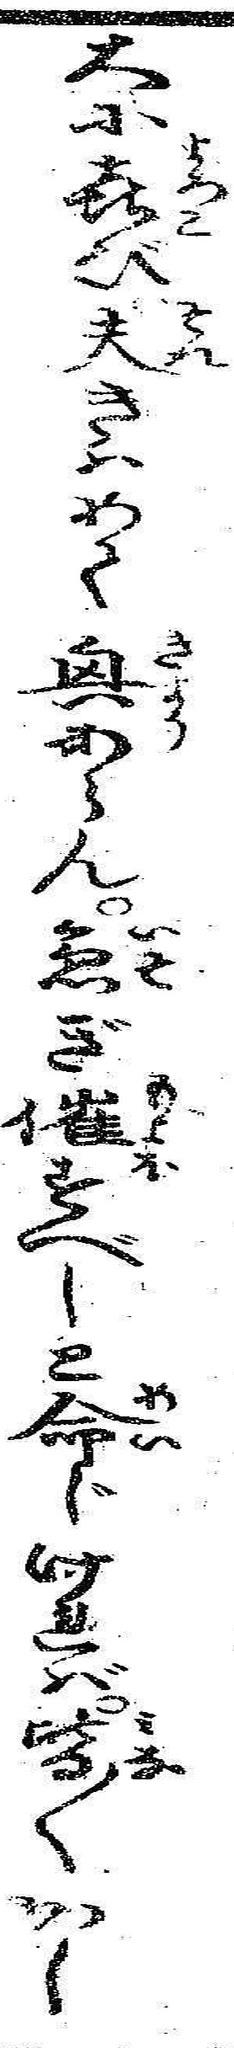大に喜び夫きはめて興あらん。急ぎ催すべしと命じければ。皆々かし
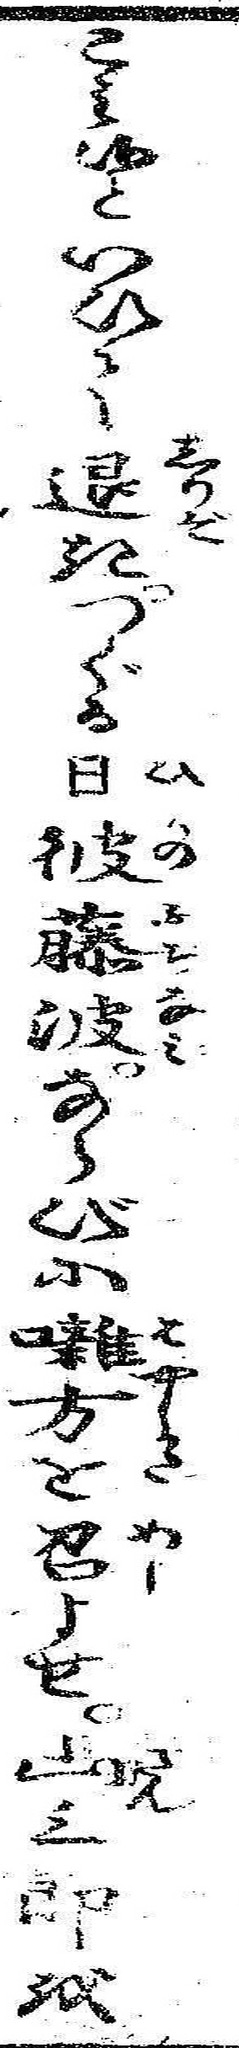こみ候といひて退き。つぐる日彼藤波。ならびに囃方を召よせ。山三郎を
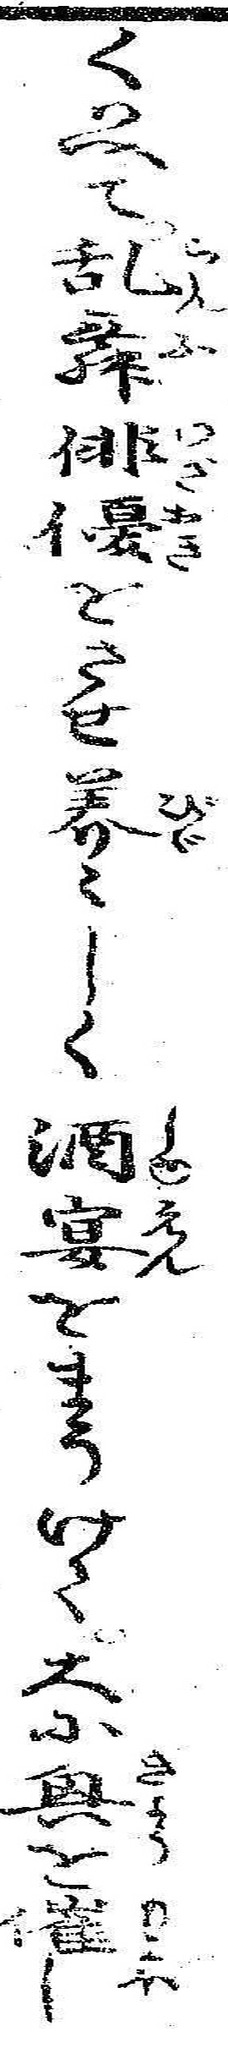くわへて。乱舞俳優をさせ美々しく酒宴をまうけて。大に興を催し
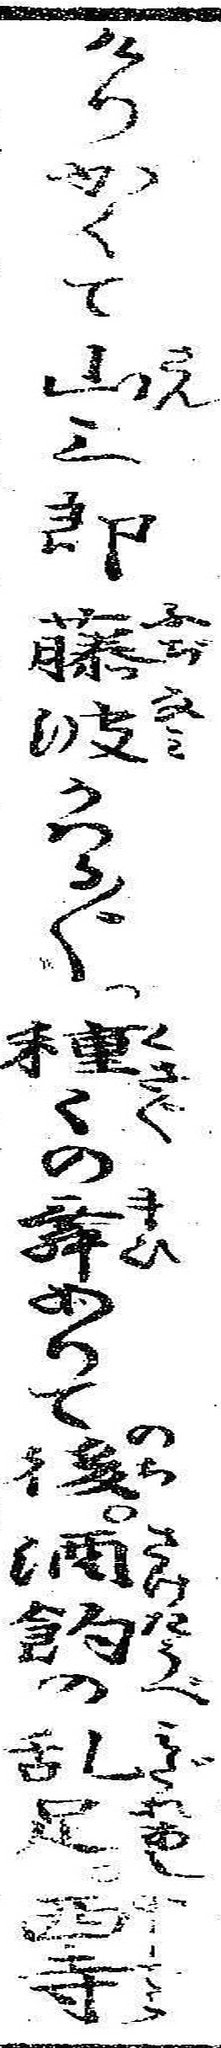けりかくて山三郎藤波かわる〴〵。種々の舞ありて後。酒の乱足。西寺
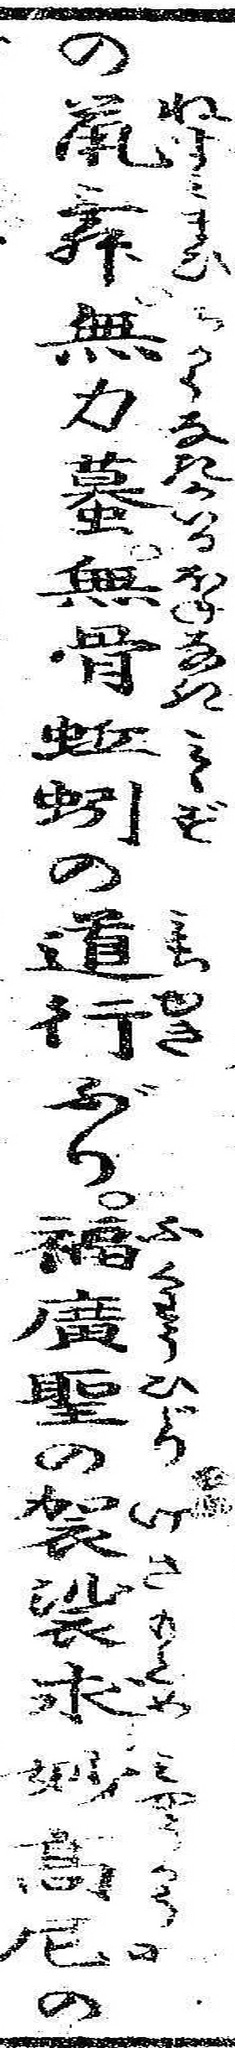の鼠舞。無力蟇。無骨蚯蚓の道行ぶり。福広聖の袈袋求妙高尼の
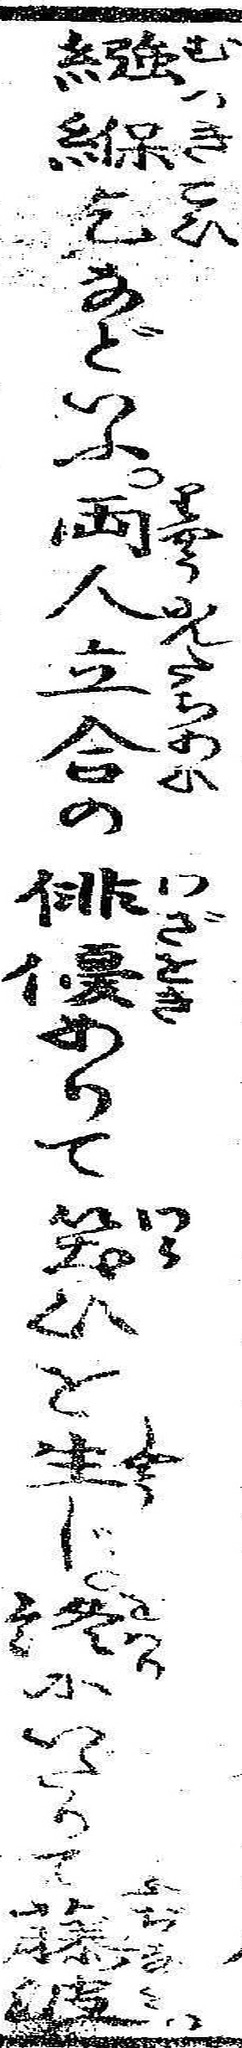繦緥乞などいふ。両人立合の俳俳優ありて笑ひを生じ。終にいたりて藤波。
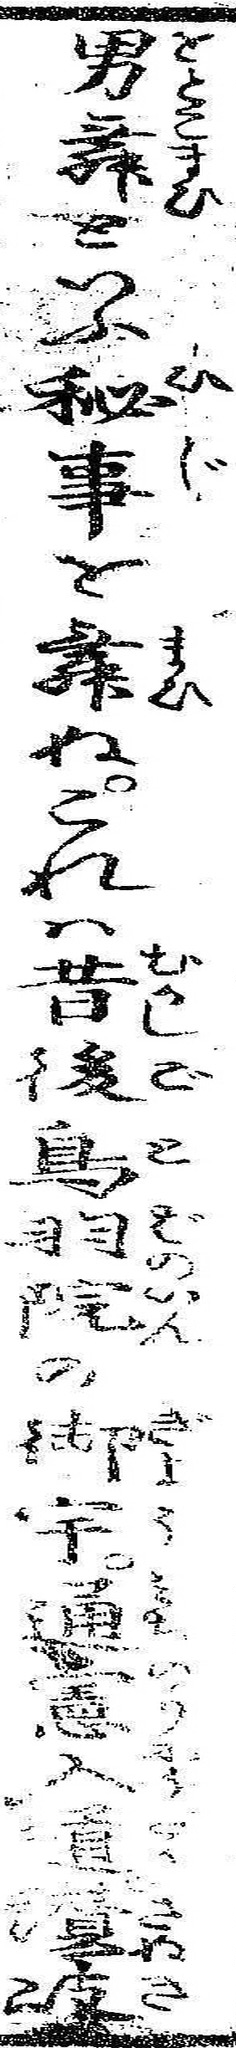男舞といふ秘事を舞ぬ。これは昔後鳥羽院の御宇。通憲入道。讃岐
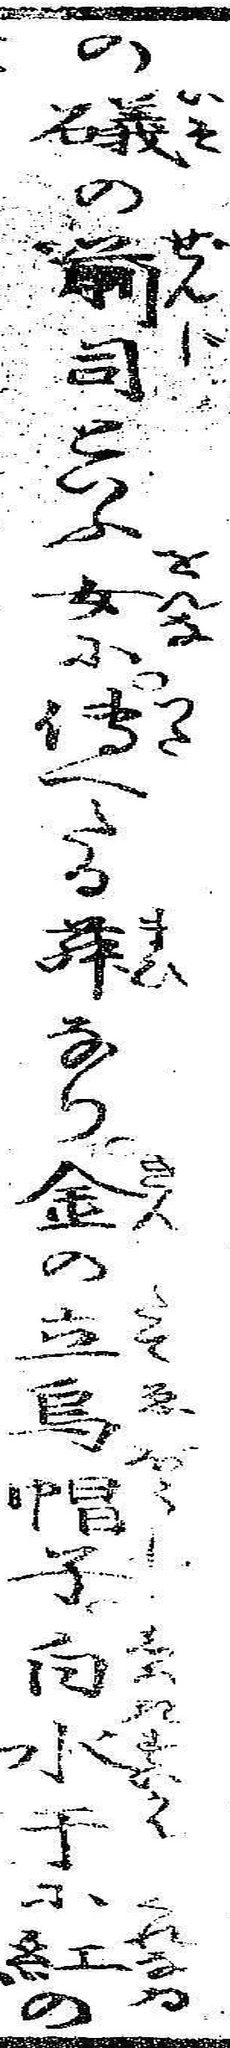の磯の前司といふ女に。伝へたる舞なり。金の立烏帽子。白水于に紅の
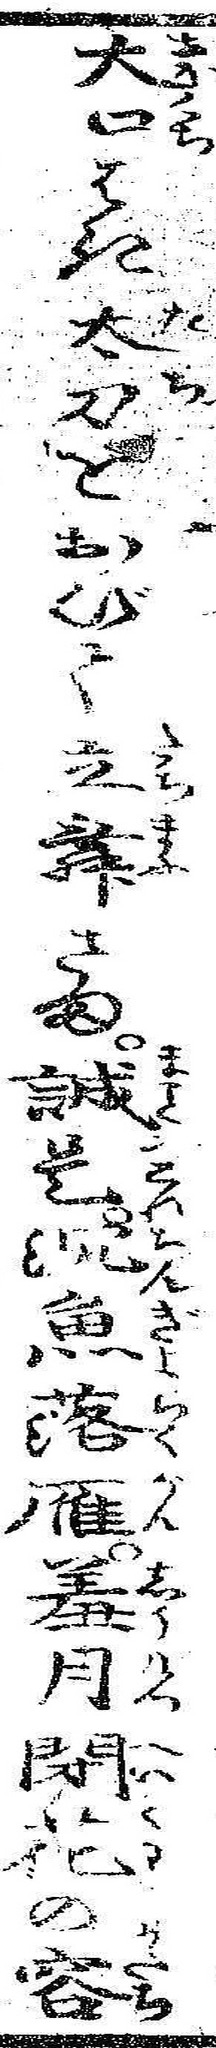大口はき太刀をおびて立舞さま。誠是。沈魚落雁。羞月閉花の容
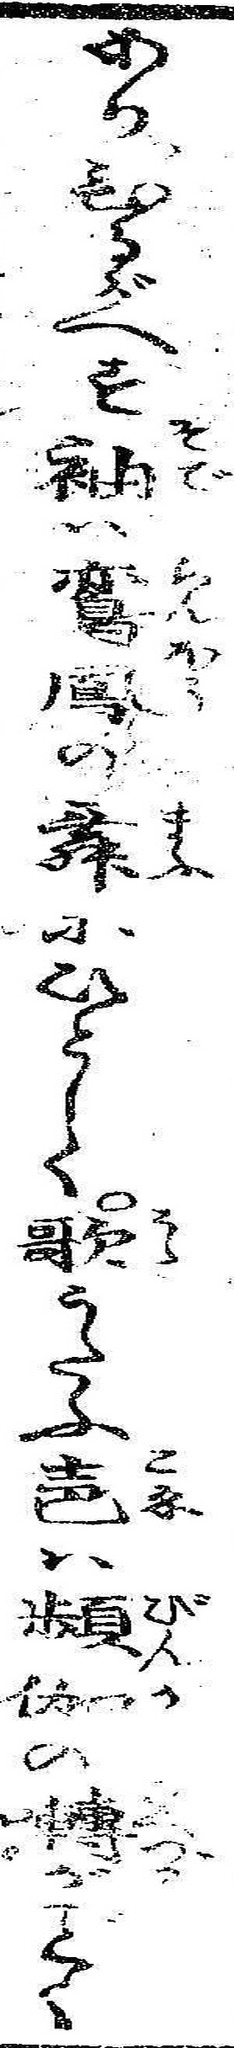あり。ひるがへす袖は鸞鳳の舞にひとしく。歌うたふ声は頻伽の囀がごとく
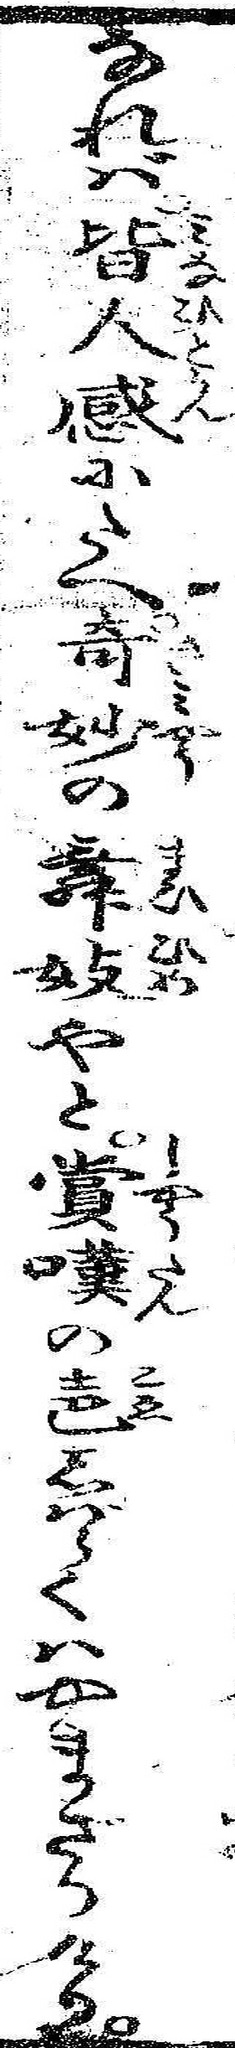なれば。皆人感にたへ。奇妙の舞妓やと。賞嘆の声しばらくはやまざりけり。
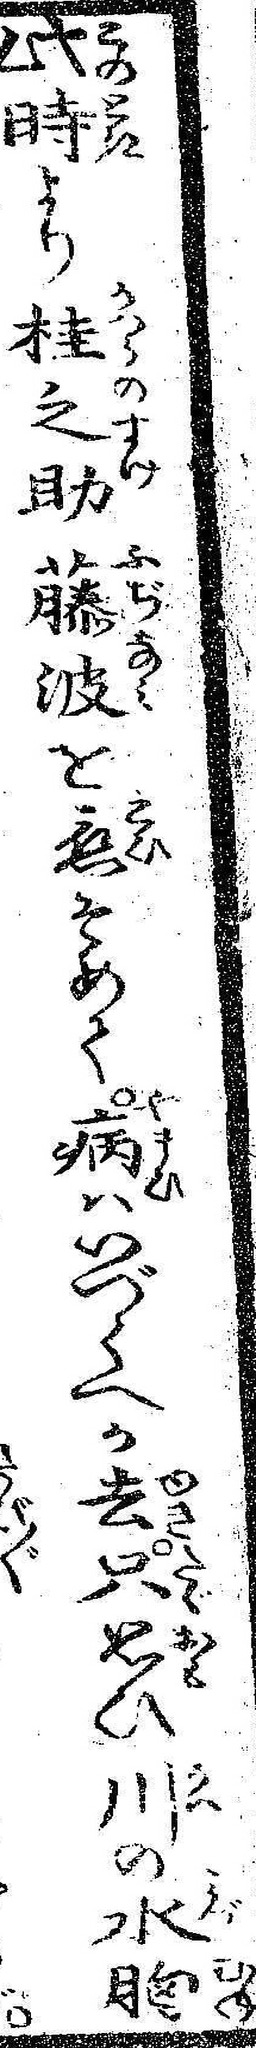此時より桂之助藤波を恋そめて。病はいづくへか去。只思ひ川の水胸
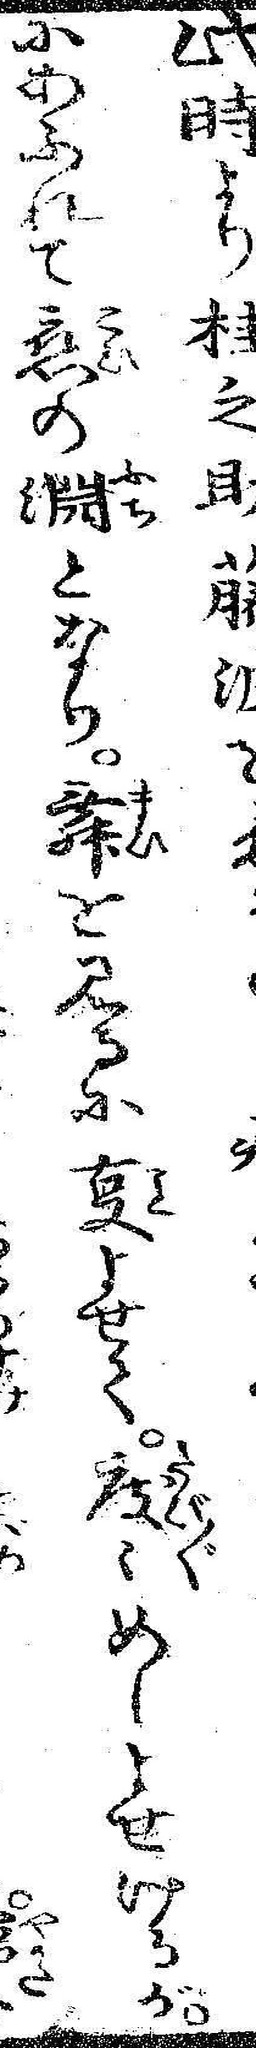にあふれて恋の淵となり。舞を見るに事よせて。度々めしよせけるが。
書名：昔話稲妻表紙
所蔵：国文学研究資料館
